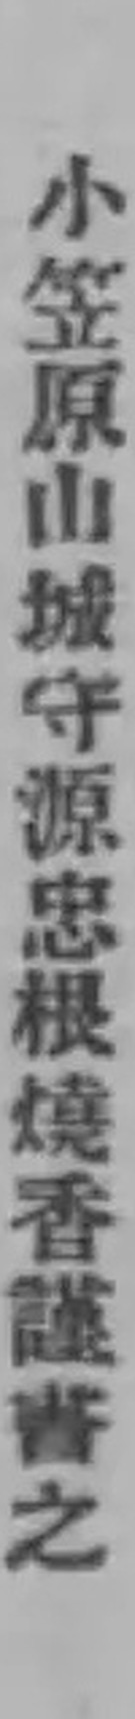小笠原山城守源忠根焼香謹書之
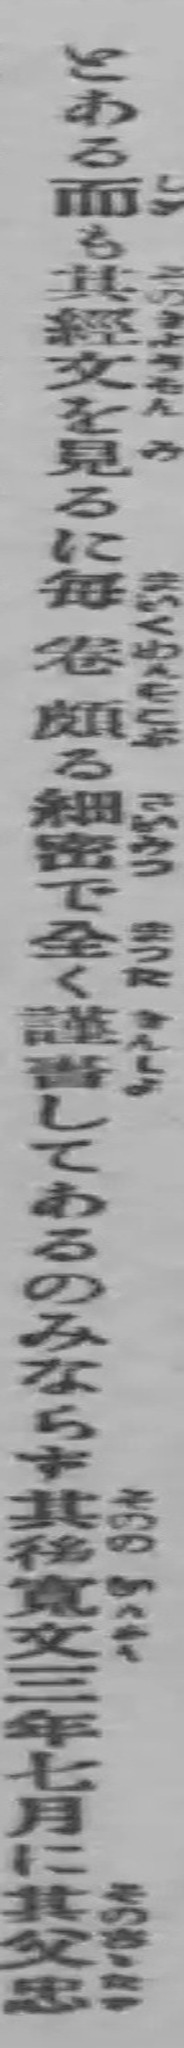とある而も其経文を見るに毎巻頗る細密で全く謹書してあるのみならず其後寛文三年七月に其父忠
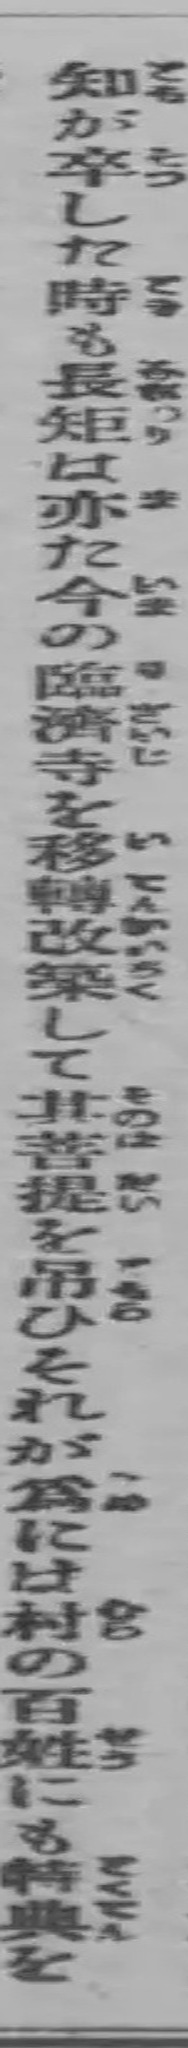知が卒した時も長矩は亦た今の臨済寺を移転改築して其菩提を吊ひそれが為には村の百姓にも特典を
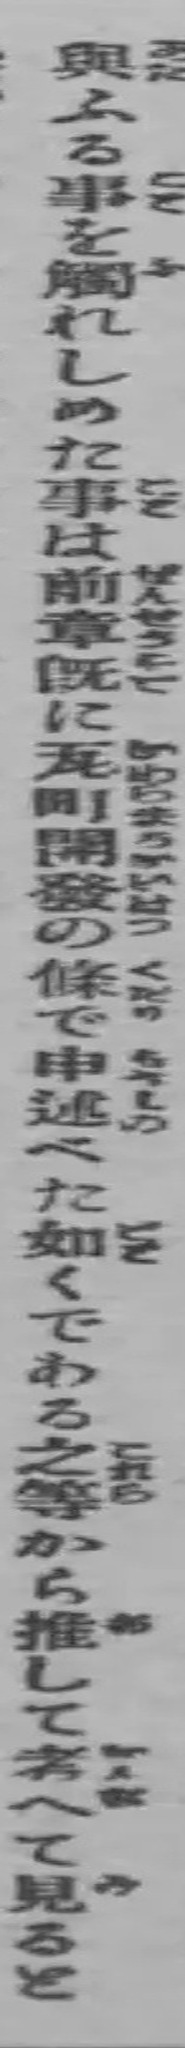与ふる事を触れしめた事は前章既に瓦町開発の条で申述べた如くである之等から推して考へて見ると
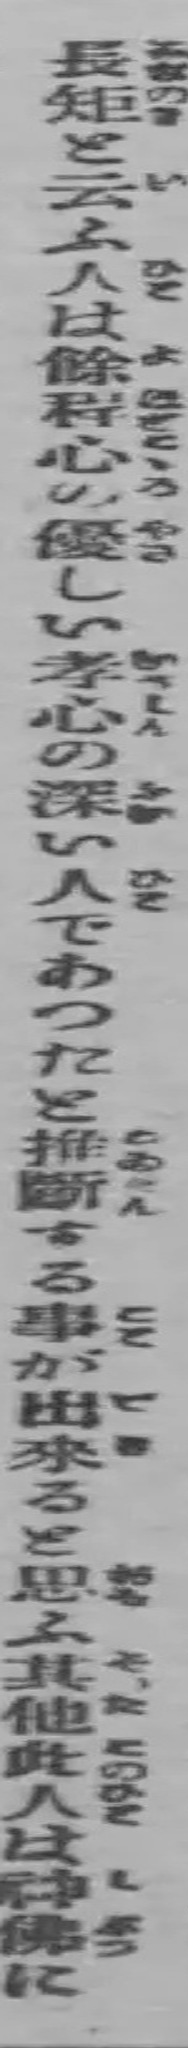長矩と云ふ人は余程心の優しい孝心の深い人であつたと推断する事が出来ると思ふ其他此人は神仏に
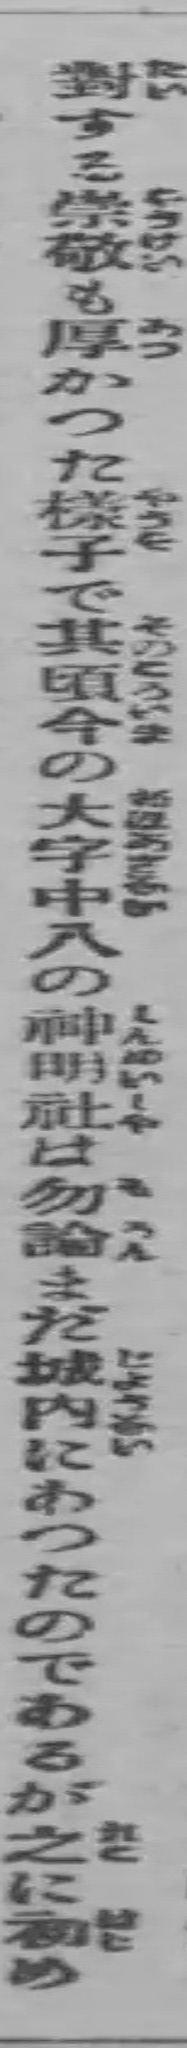対する崇敬も厚かつた様子で其頃今の大字中八の神明社は勿論まだ城内にあつたのであるが之に初め
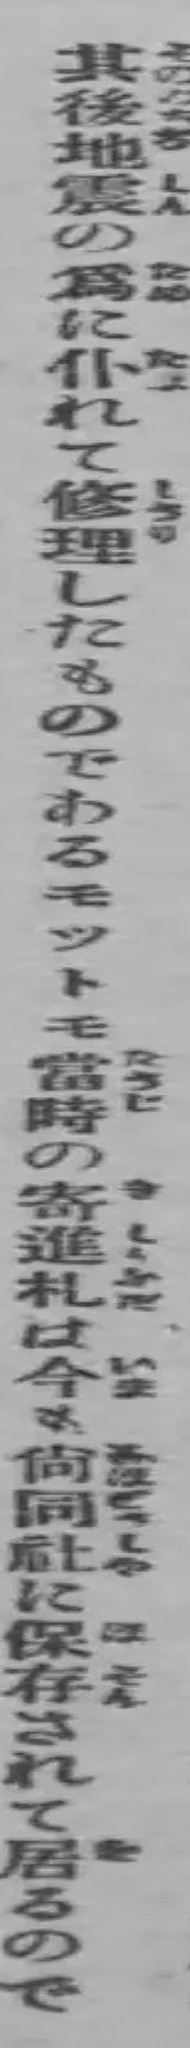其後地震の為に仆れて修理したものであるモツトモ当時の寄進札は今も尚同社に保存されて居るので
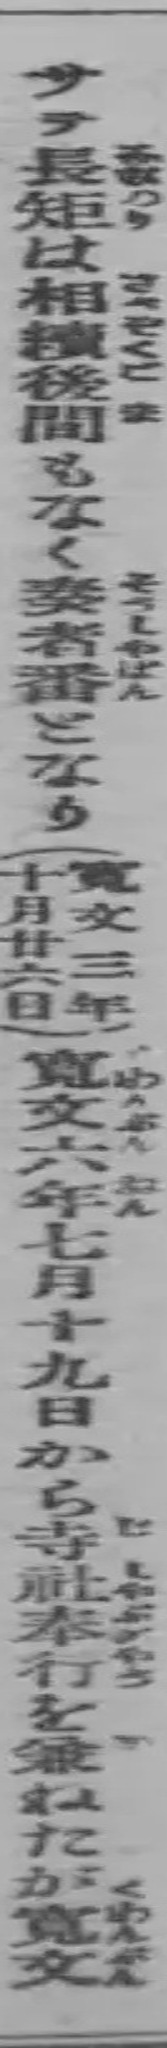サテ長矩は相続後間もなく奏者番となり(寛文三年十月廿六日)寛文六年七月十九日から寺社奉行を兼ねたが寛文
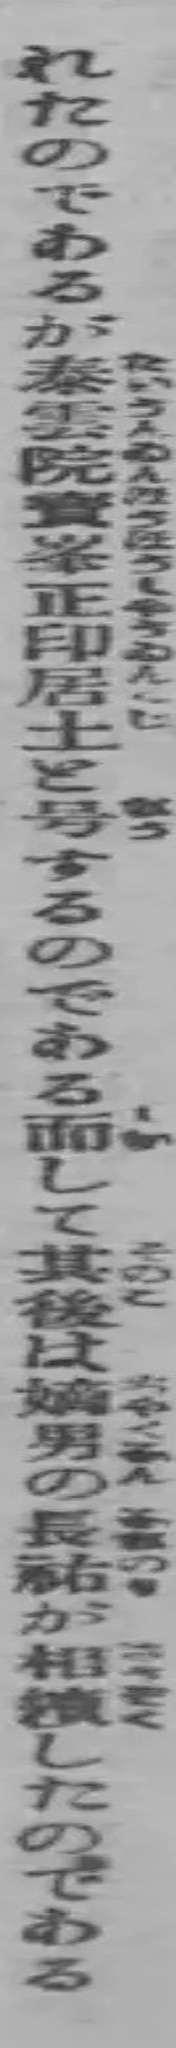れたのであるが泰雲院宝峯正印居士と号するのである而して其後は嫡男の長祐が相続したのである
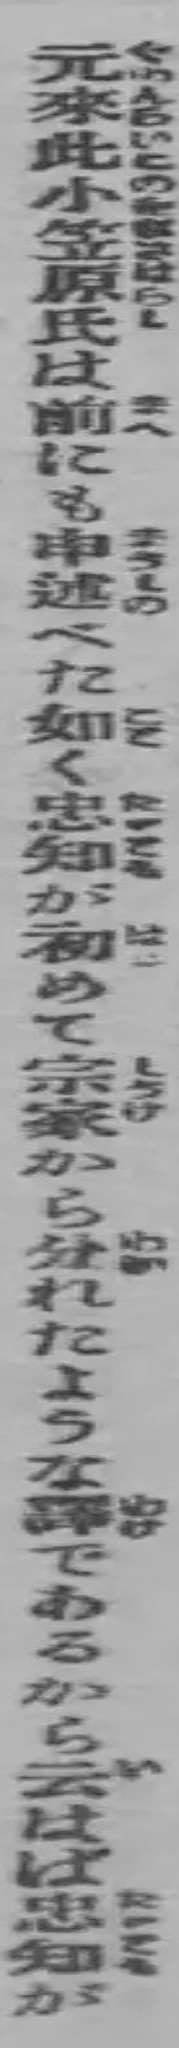元来此小笠原氏は前にも申述べた如く忠知が初めて宗家から分れたような訳であるから云はば忠知が
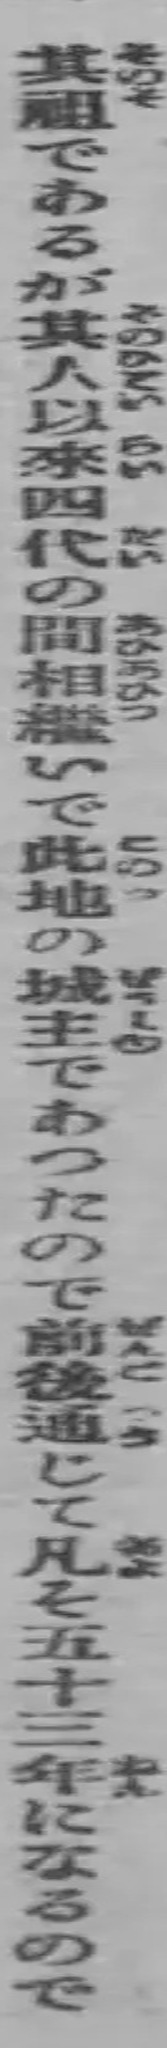其祖であるが其人以来四代の間相継いで此地の城主であつたので前後通じて凡そ五十三年になるので
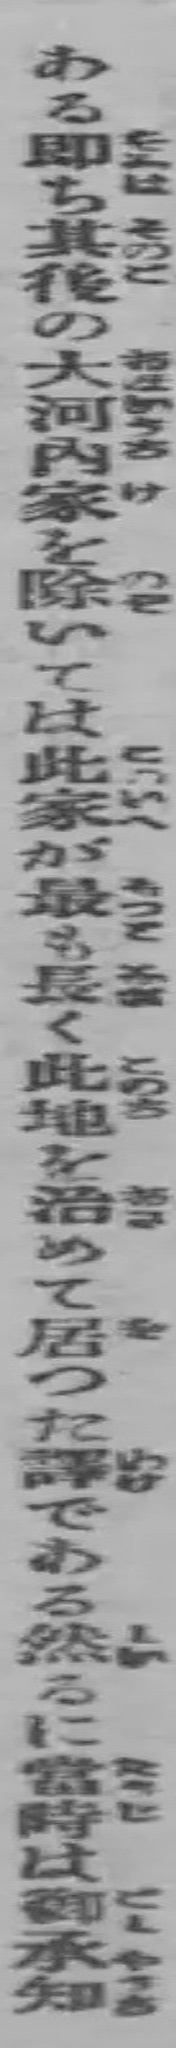ある即ち其後の大河内家を除いては此家が最も長く此地を治めて居つた訳である然るに当時は御承知
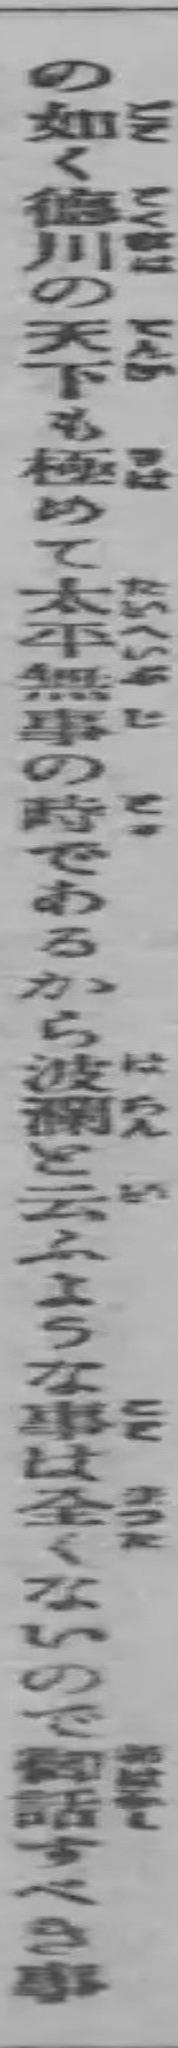の如く徳川の天下も極めて太平無事の時であるから波瀾と云ふような事は全くないので御話すべき事
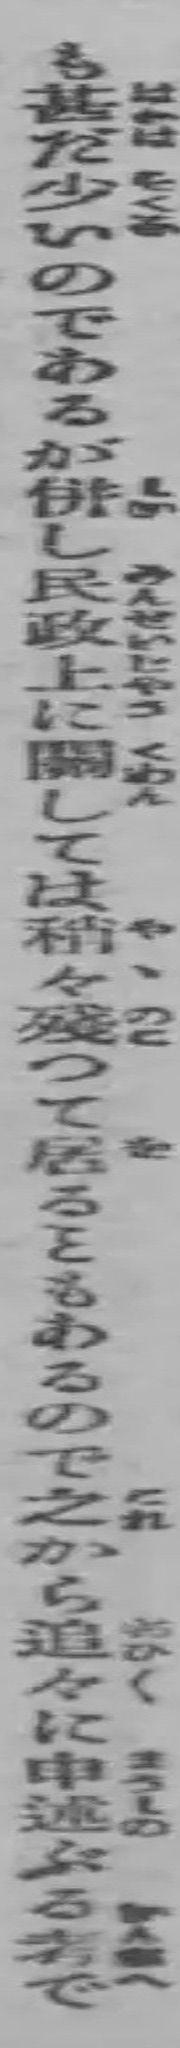も甚だ少いのであるが併し民政上に関しては稍々残つて居ることもあるので之から追々に申述ぶる考で
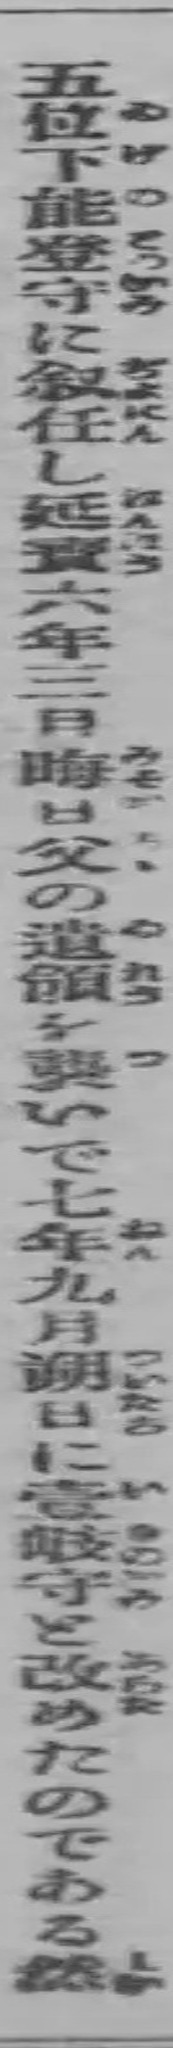五位下能登守に叙任し延宝六年三月晦日父の遺領を襲いで七年九月朔日に壱岐守と改めたのである然
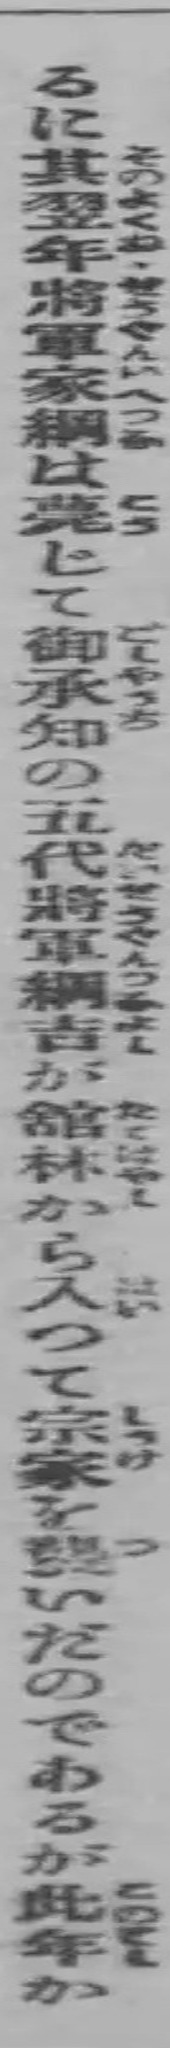るに其翌年将軍家綱は薨じて御承知の五代将軍綱吉が舘林から入つて宗家を襲いだのであるが此年か
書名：豊橋市史談
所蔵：国立国会図書館 National Diet Library, JAPAN
